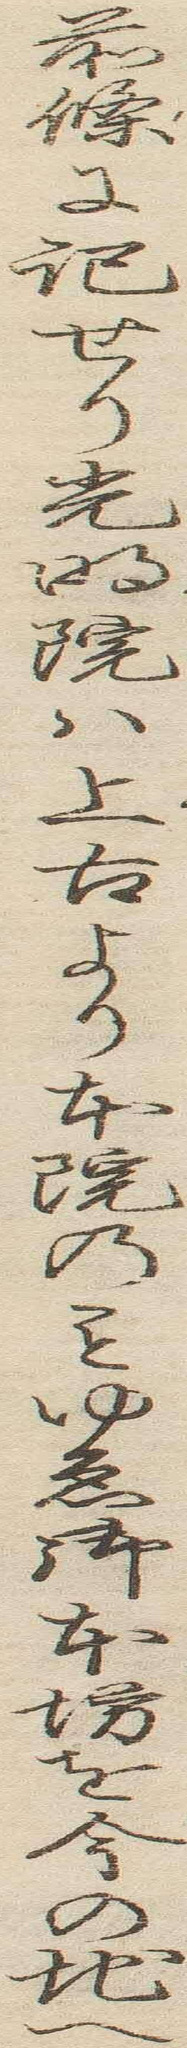前條に記せり光明院は上古より本院のことゆゑ御本坊を今の地へ

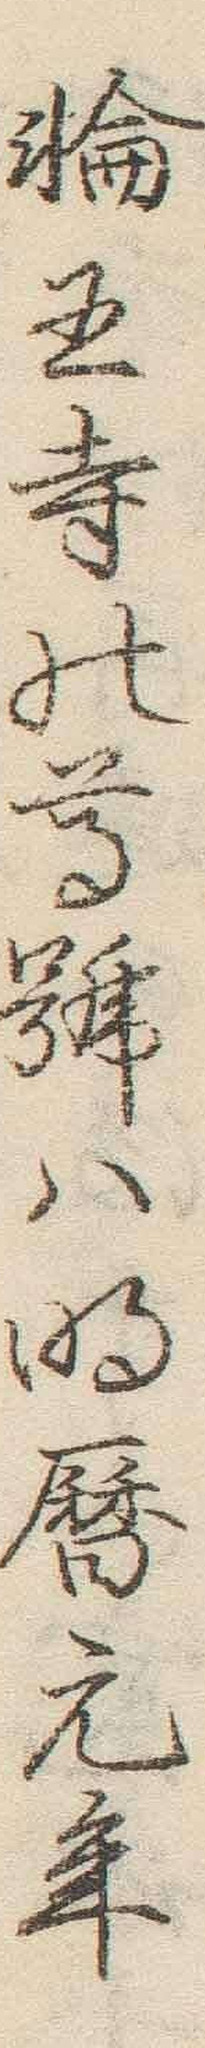輪王寺の尊號は明歷元年
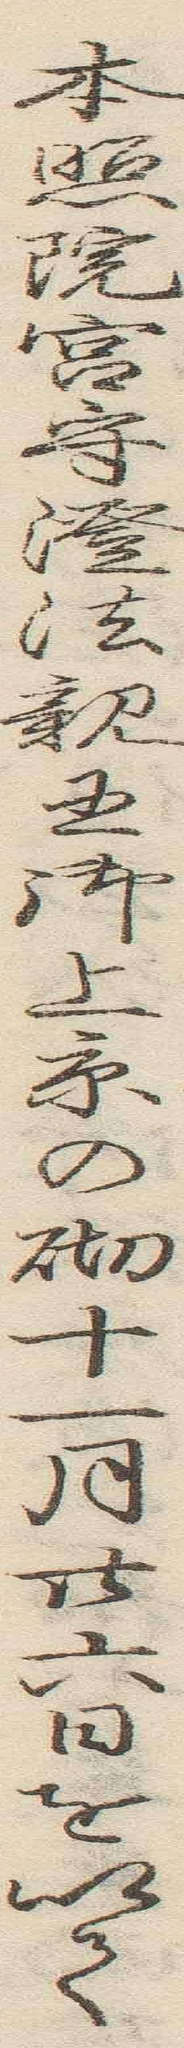本照院宮守澄法親王御上京の砌十一月廿六日を以て
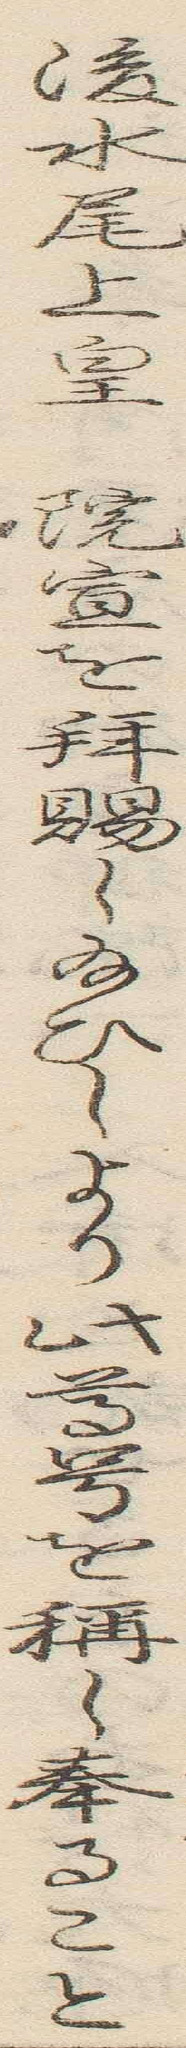後水尾上皇院宣を拜賜し給ひしより此尊号を稱し奉ること
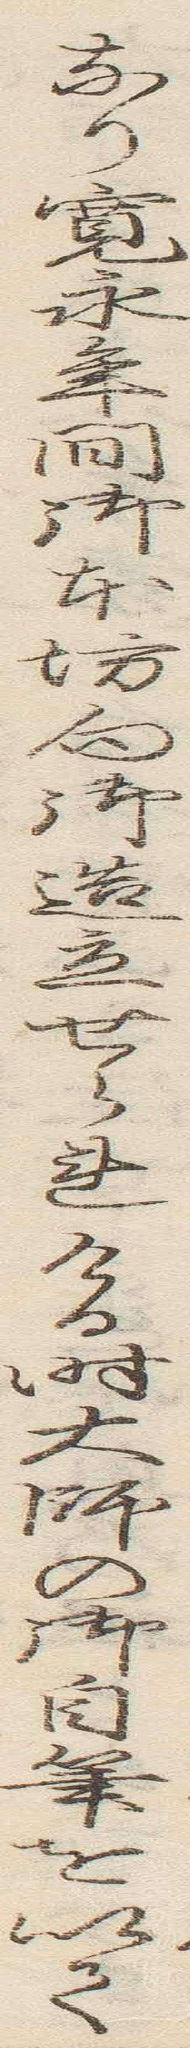なり寛永年間御本坊向御造立せられける时大師の御自筆を以て
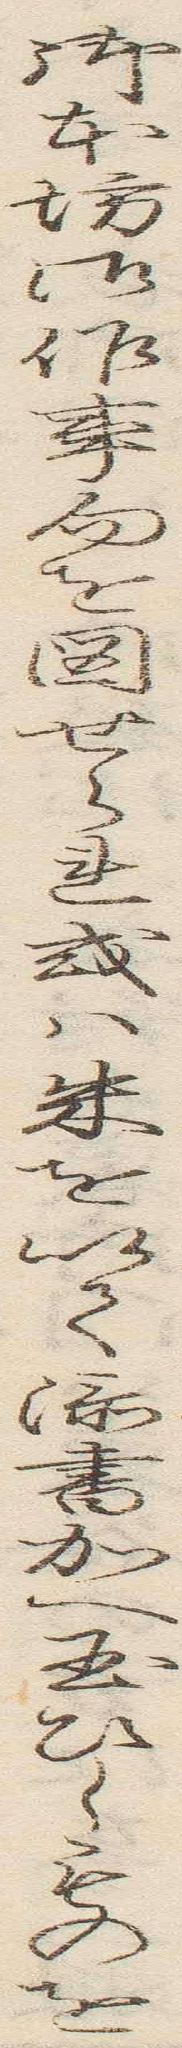御本坊御作事向を図せられ或は朱を以て添書加へ玉ひしものを
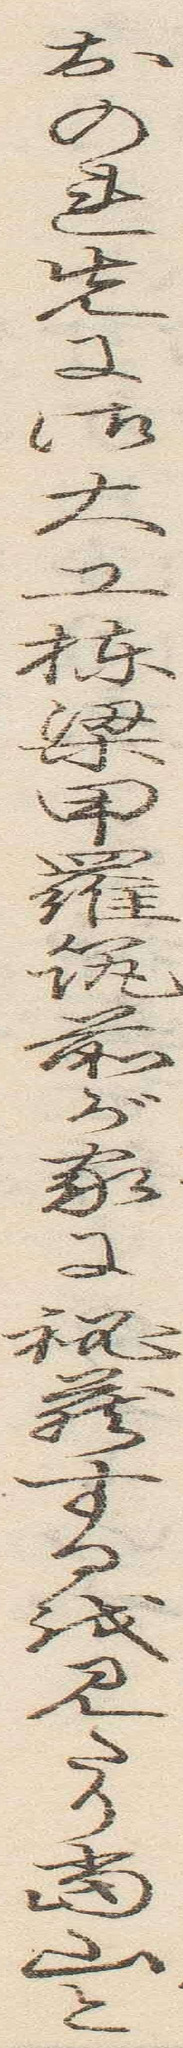おのれ先に御大工棟梁甲羅筑前が家に秘蔵するを見たり當山と
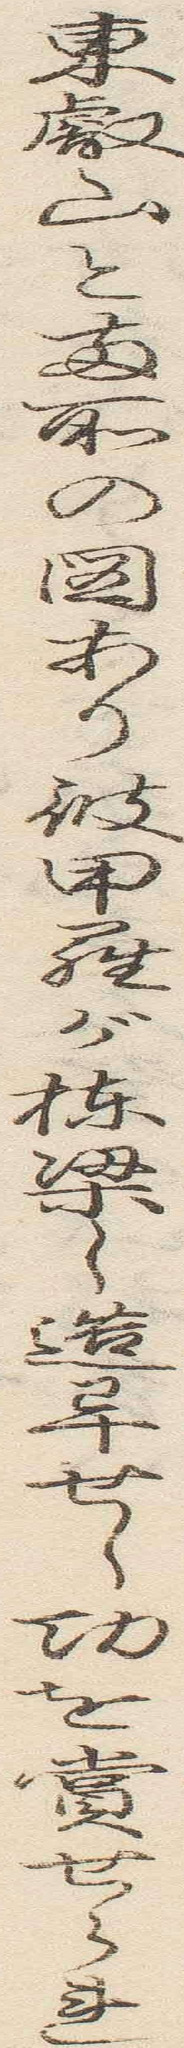東叡山と両所の図あり彼甲羅が棟梁し造畢せし功を賞せられ
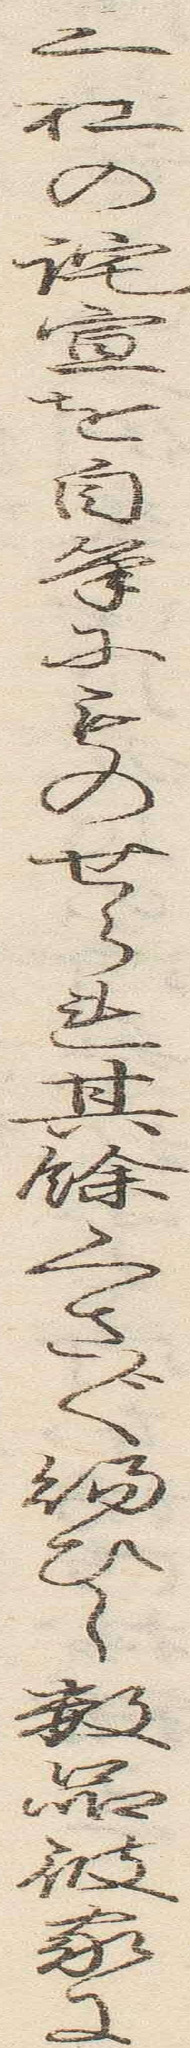三社の詫宣を自筆にものせられ其餘くさ〴〵賜ひし数品彼家に
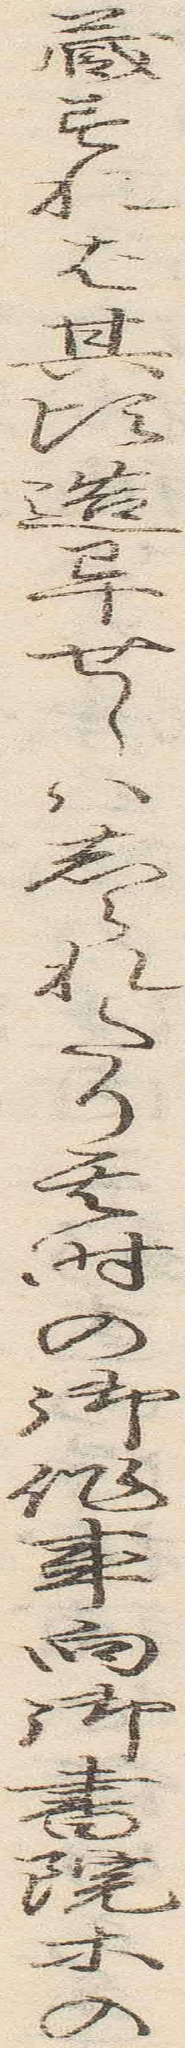蔵すれば其頃造畢せしはしられたり其时の御作事向御書院等の
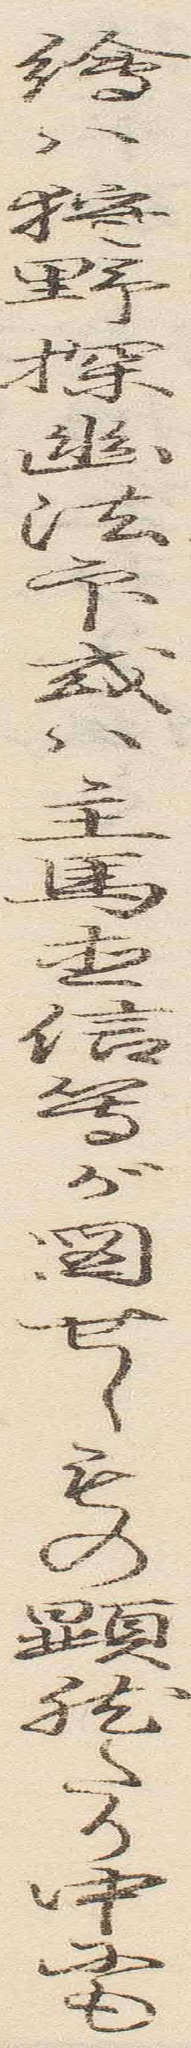繪は狩野探幽法印或は主馬直信等が図せしもの顕然たり中にも
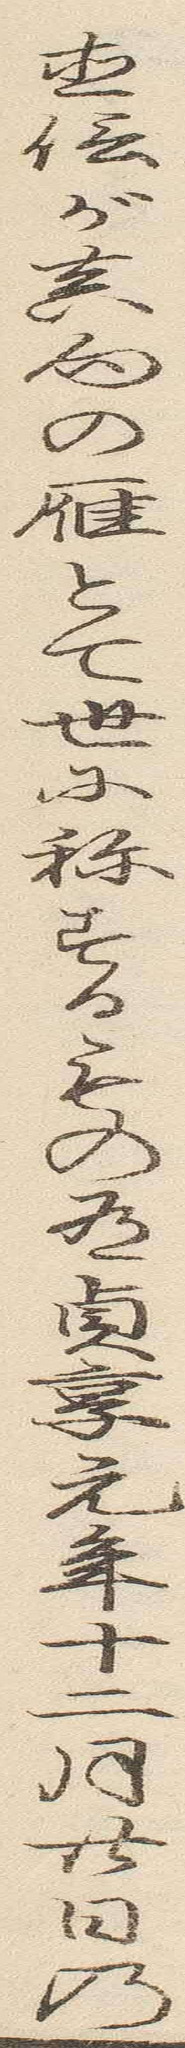直信が真向の雁とて世に称するもの有貞享元年十二月廿日の
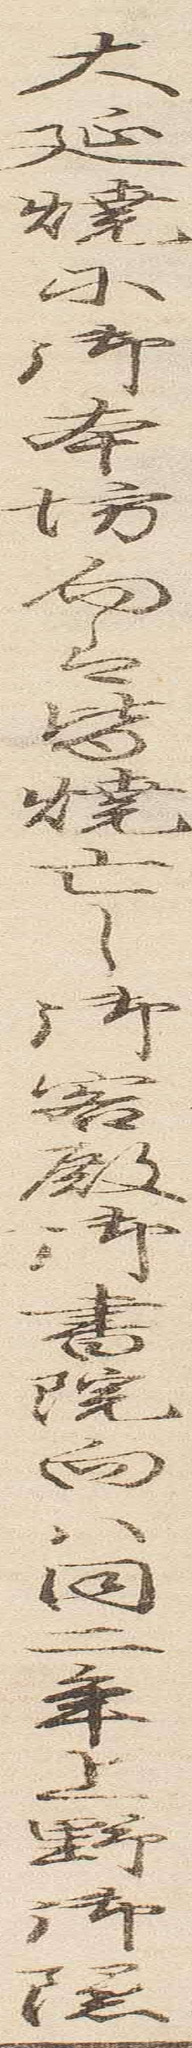大延焼に御本坊向は皆焼亡し御客殿御書院向は同二年上野御隠
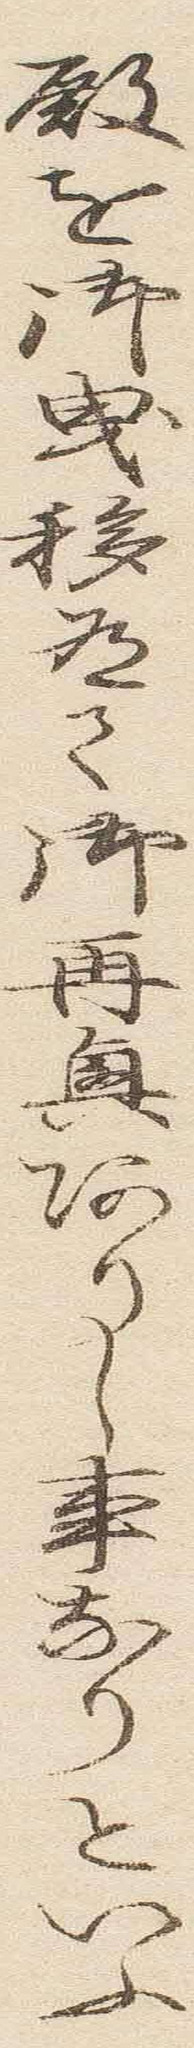殿を御曳移有て御再興ありし事なりといふ
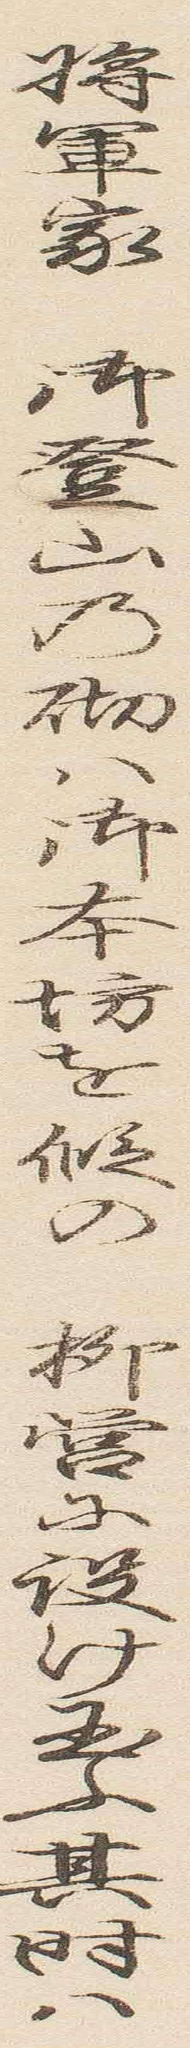将軍家御登山の砌は御本坊を假の柳営に設け玉ふ其时は
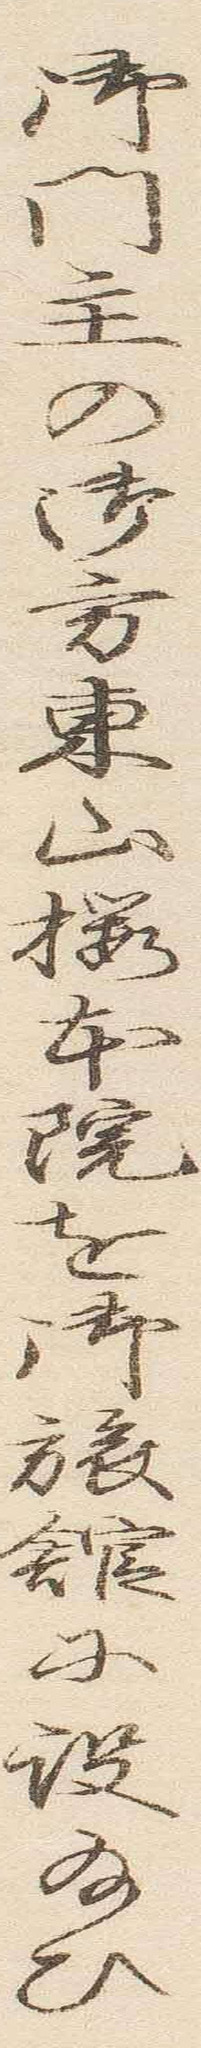御門主の御方東山桜本院を御旅舘に設給ひ
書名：日光山志
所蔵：東京学芸大学附属図書館 国文学研究資料館
